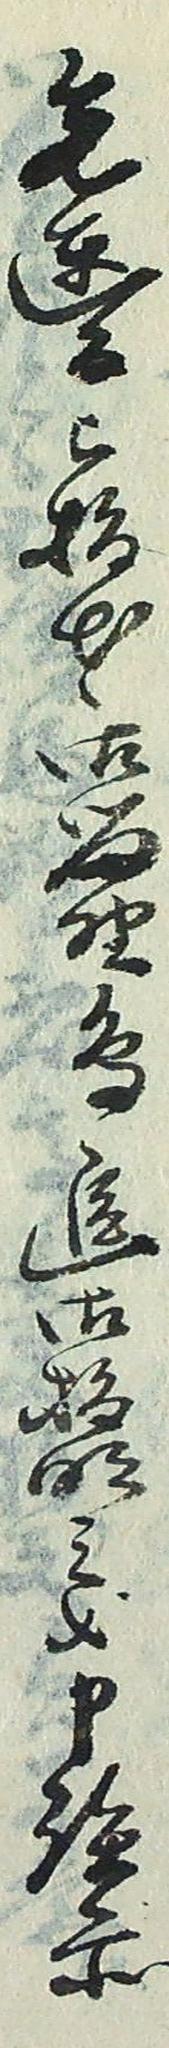先達而被指出候御留野鳥追御指明之義申談候所
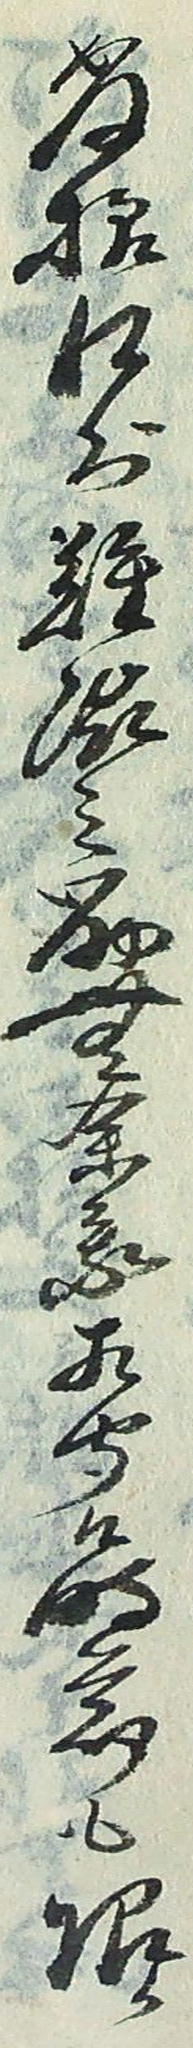如何様郷分難渋之筋無余義相聞候時節も限り
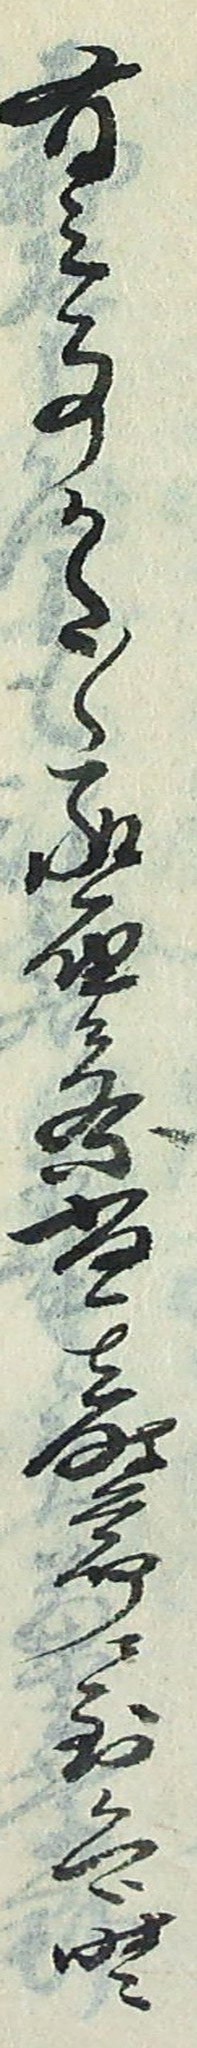有之事かた〳〵承届候条尚其時節ニ到候へハ時々
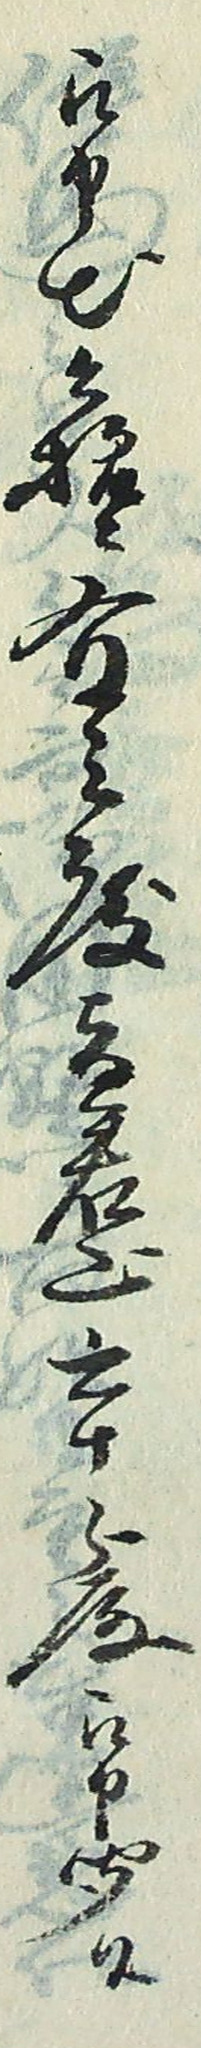被申出候様ニ有之度旨若山六十郎殿被申聞候
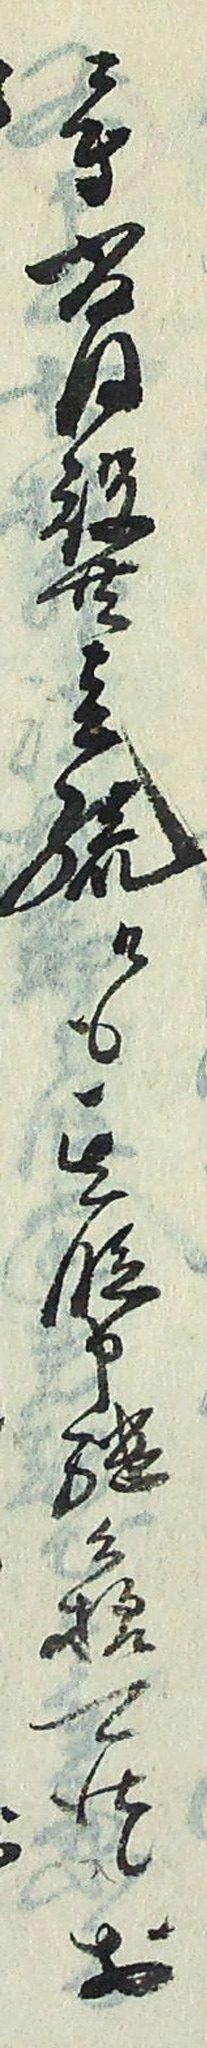ニ付尚同役共壱統江も其段申継候様可仕候於
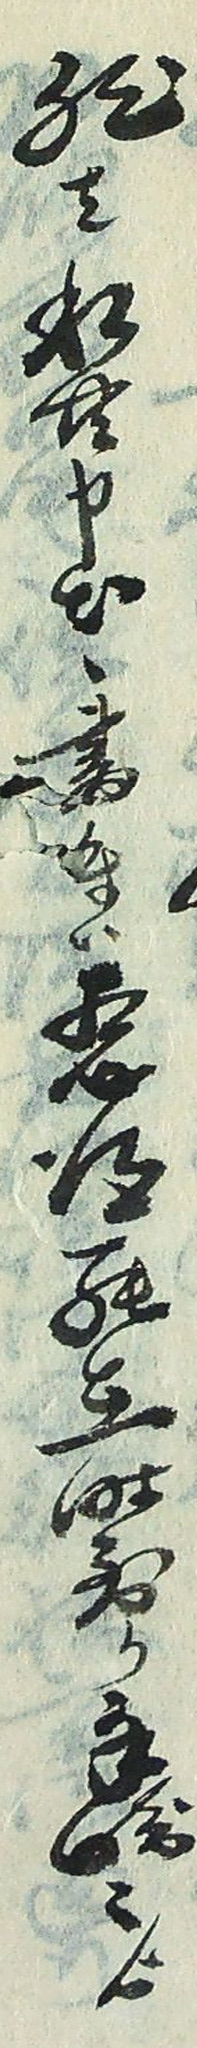然者私共申出候書付ハ相心得罷在時到り手崎々ゟ
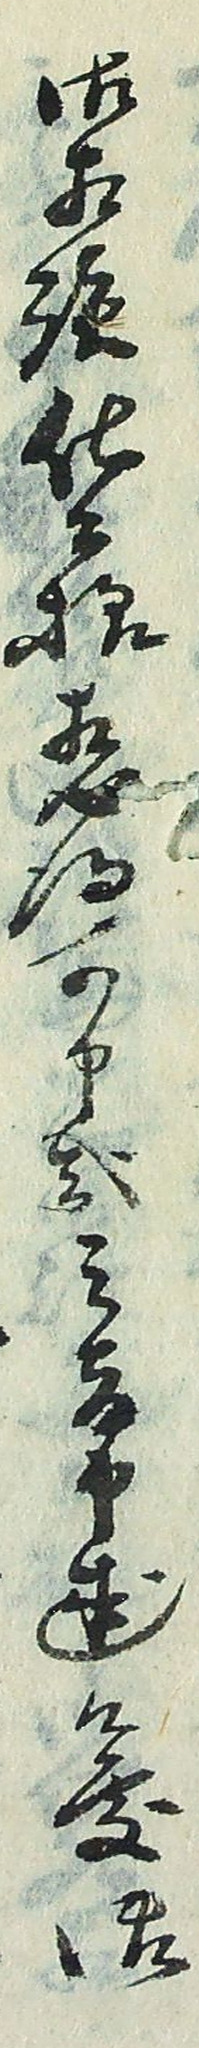御相談仕候様相心得可申哉之旨申述候處御
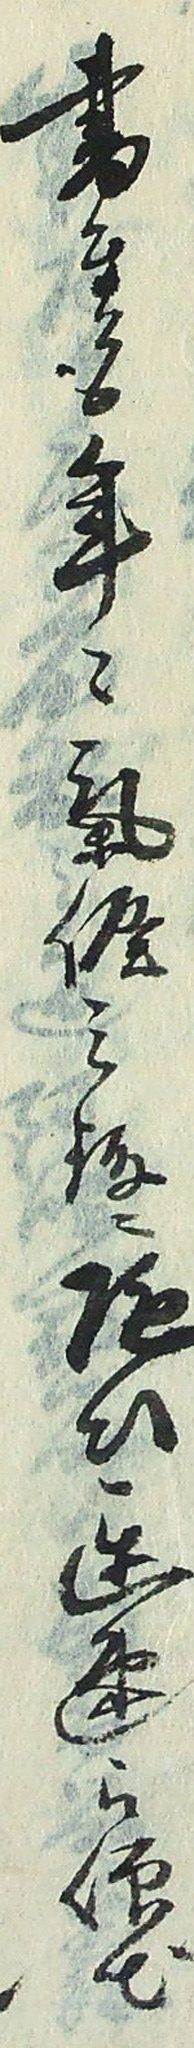書付ニも年々氣候之趣ニ随ひ遅速被仰出
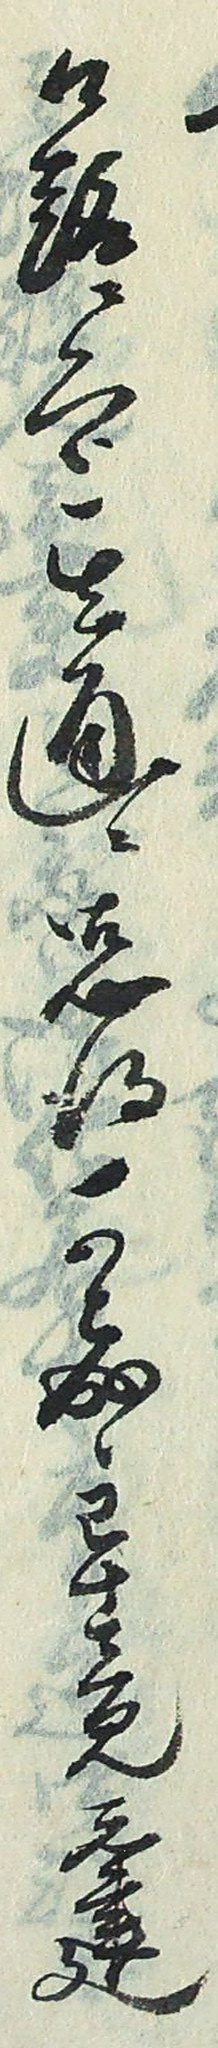候趣ニ候へハ其通ニ御心得可被成候畢竟元建
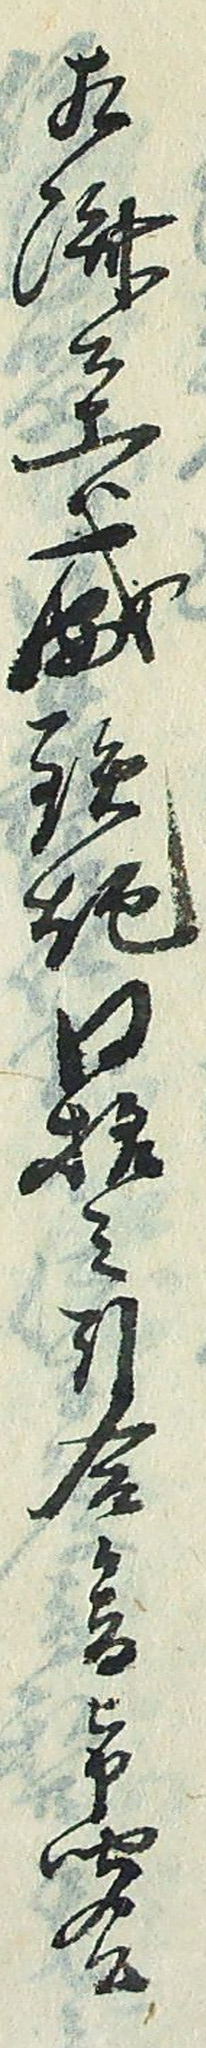相済候上ハ威鉄砲同様之引合候旨被申聞候

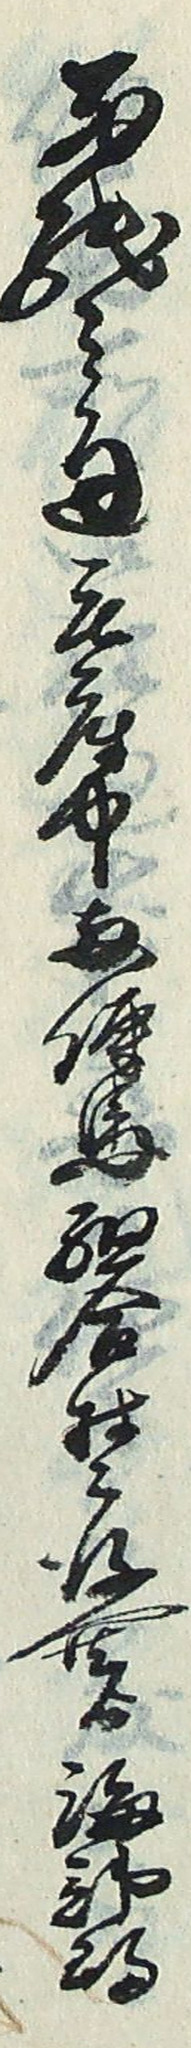別紙之通庄屋中両傳馬組合村々役人共ゟ海部郡
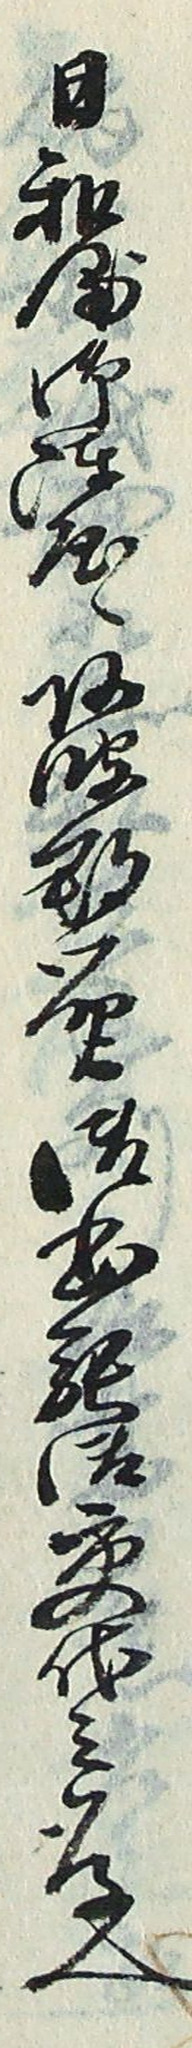日和浦御陣屋へ阿波郡筋ゟ御出張御交代之御役人
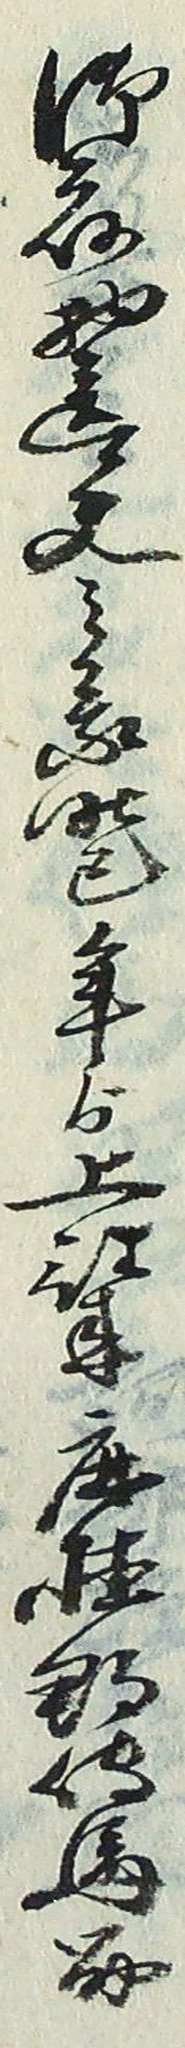御荷物送り夫之義昨巳年ゟ上往来麻植郡傳馬筋
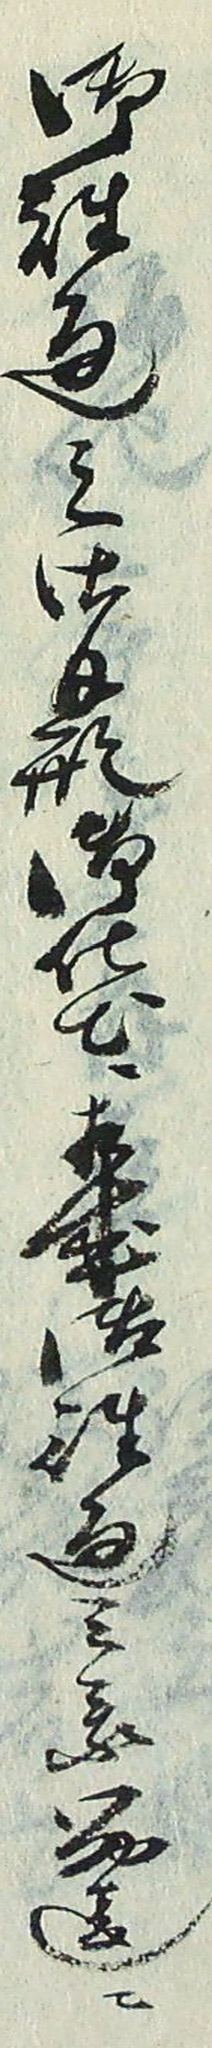御往通之御手形御仕出ニ相成御往通之義筋違ニ
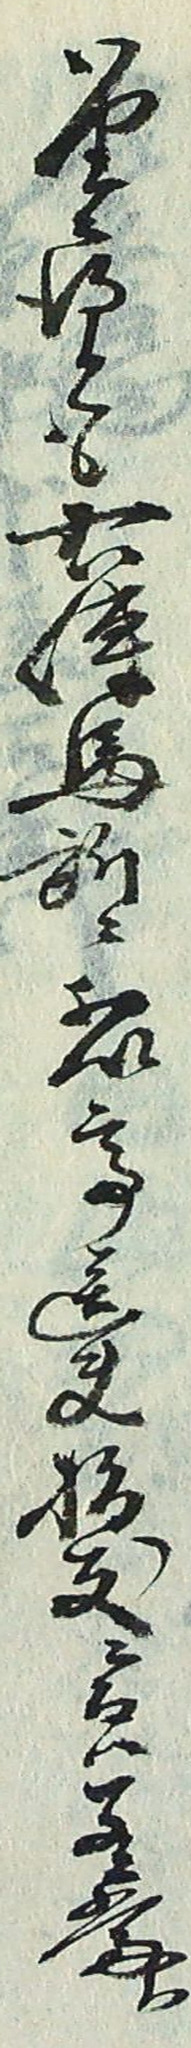御坐候得とも右傳馬所ニおいて送夫指支ニ而ハ差當り
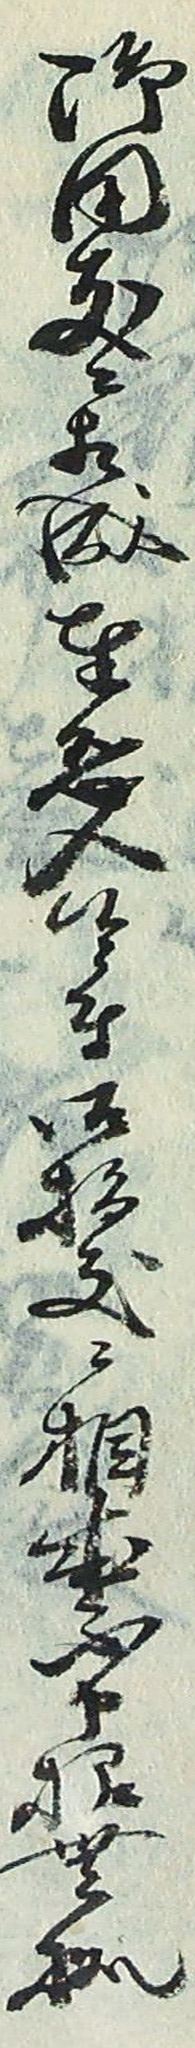御用支ニ相成奉恐入候ニ付御指支ニ相成不申様無據
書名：諸御趣意書并御下知向之写
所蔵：鳴門教育大学 Naruto University of Education
